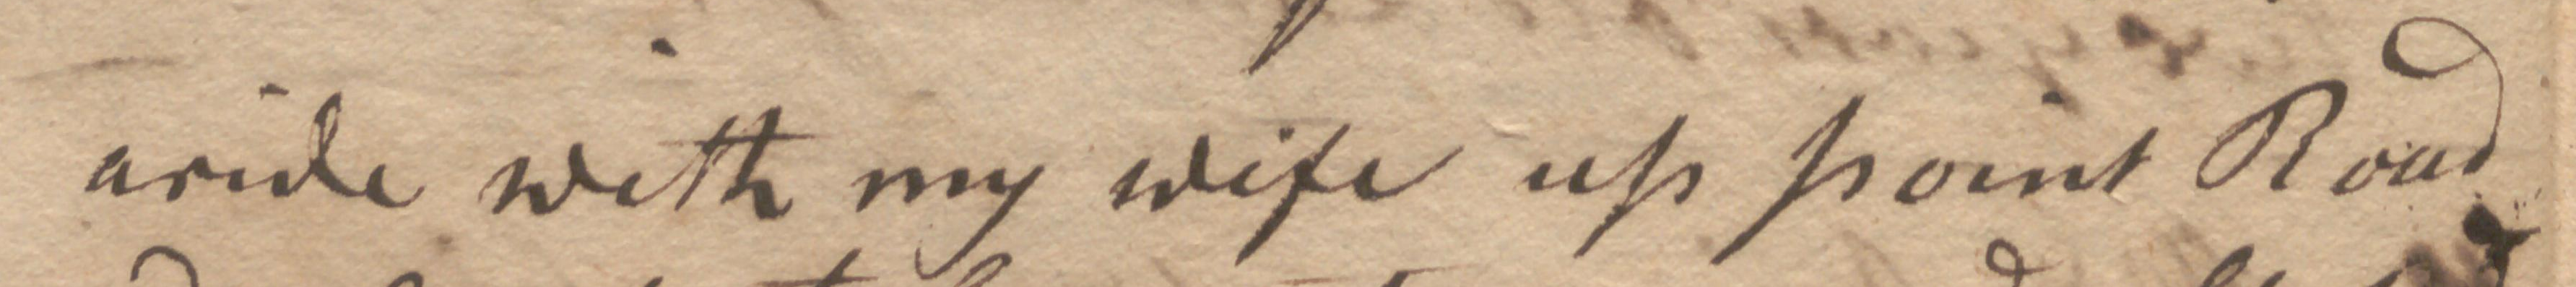a ride with my wife up point Road
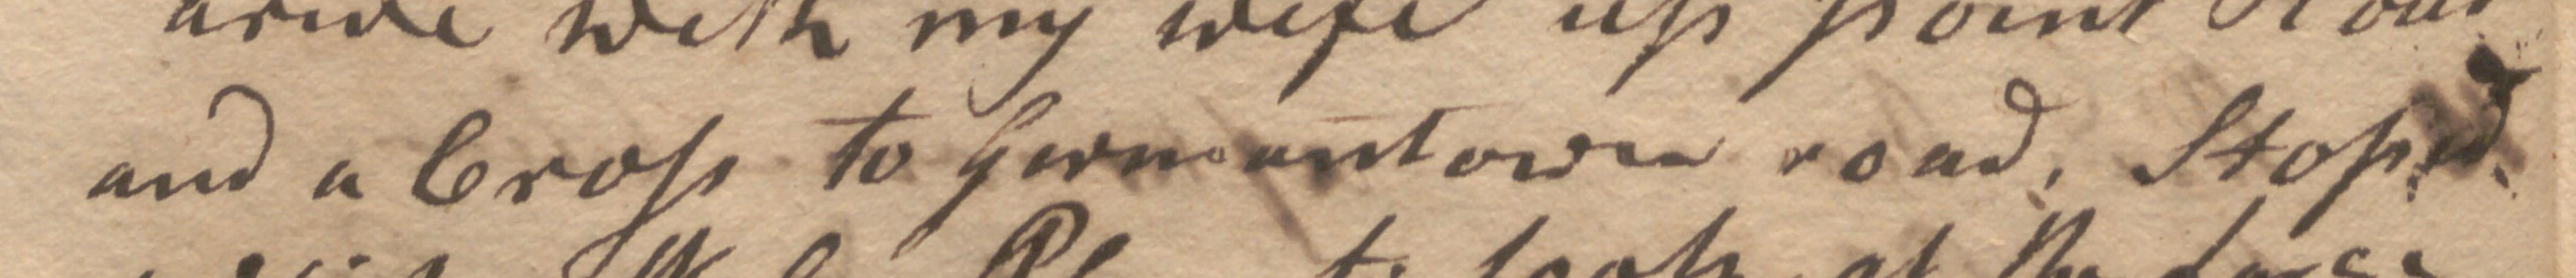and a Cross to Germantown road. Stoped
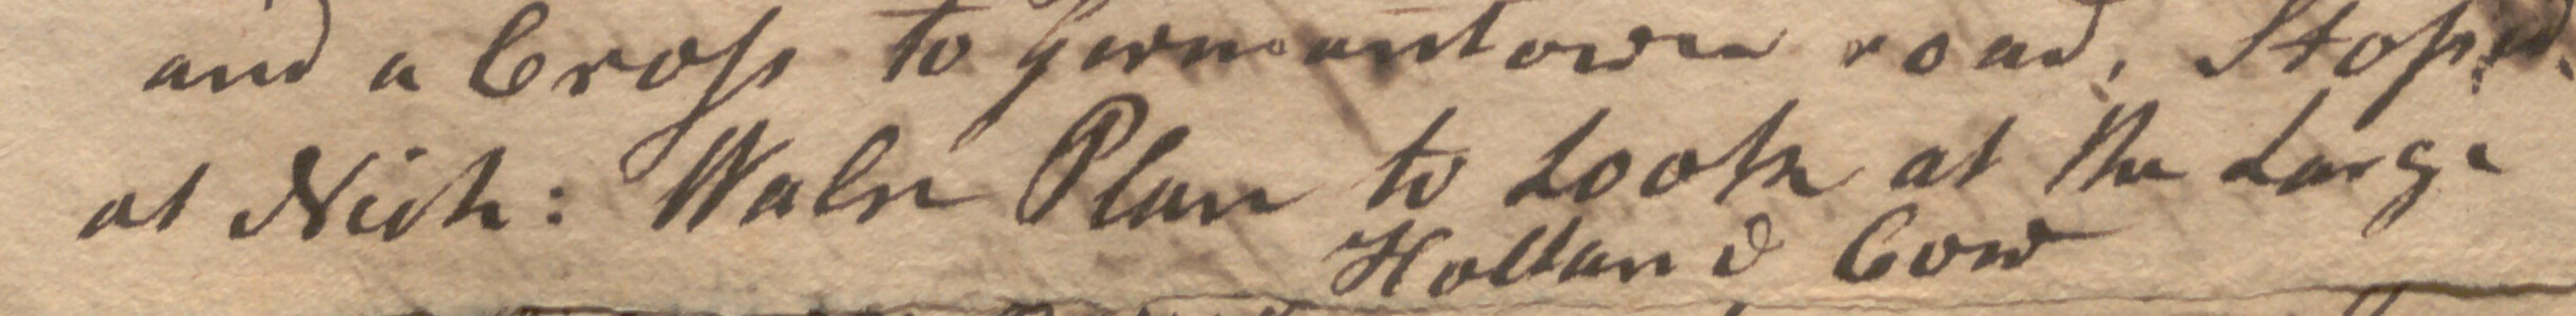at Nich: Waln Plan to Look at the Large
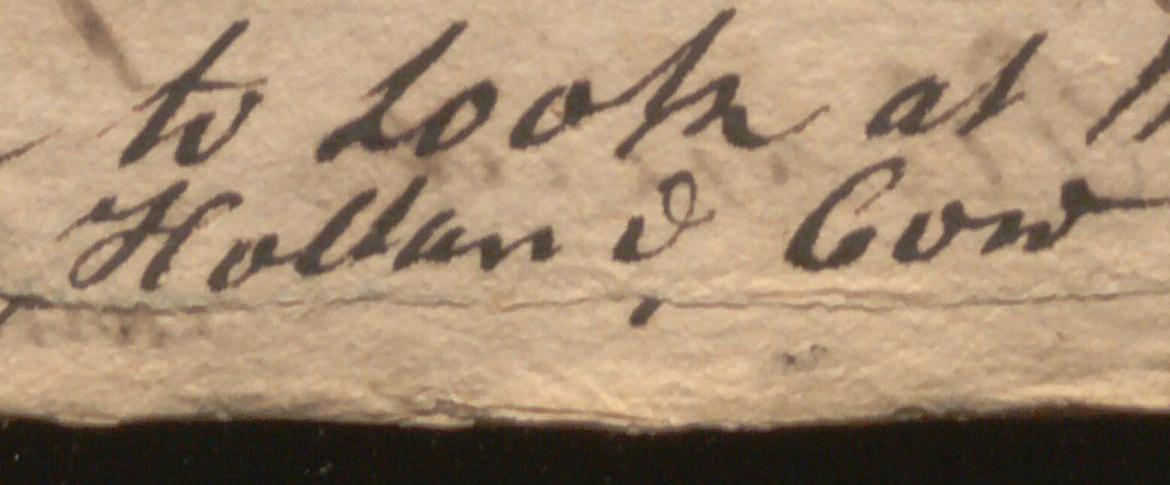Holland Cow
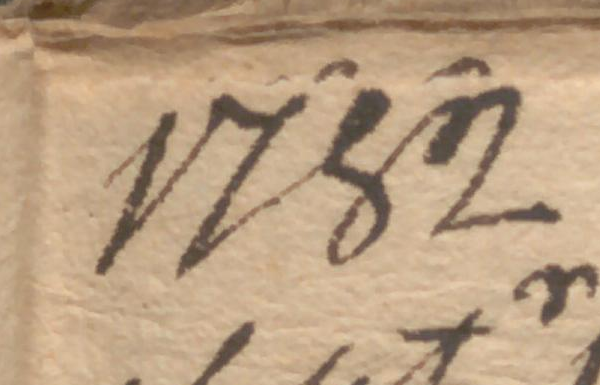1782
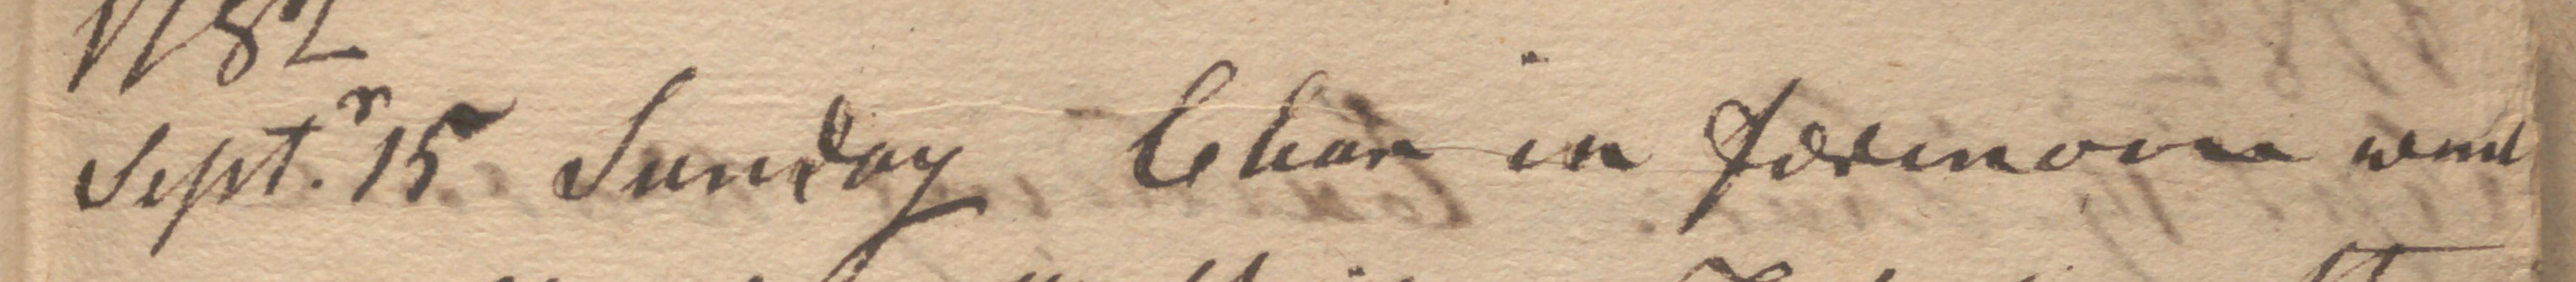Sept^r. 15^th Sunday Clear in forenon went
